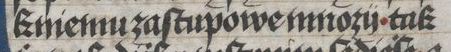kniemu zaſtupowe mnozij.tak¬
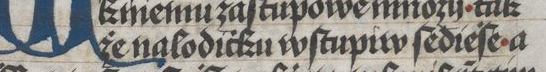že nalodiċku wſtupiw ſedíeẛe.a
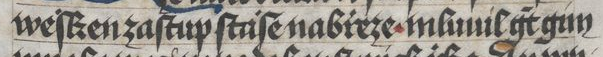weẛken zaſtup ſtaẛe nabṙeze.mluuil ḡt gim
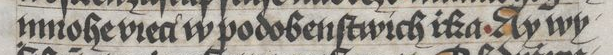mnohe vieci w podobenſtwích ṙka.Ay wy¬
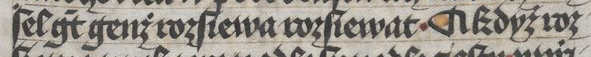ẛel ḡt genż rozſiewa rozſiewat.A kdyż roz¬
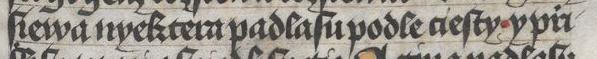ſiewa nyektera padla ſu podle cieſty.y pṙi¬
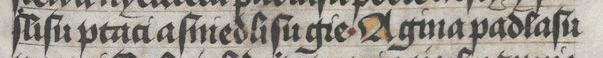ẛli ſu ptaci a ſniedli ſu gie.A gina padla ſu
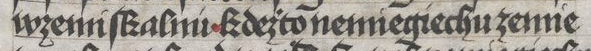wzemi ſkalnú.kdeżto nemiegiechu zemie
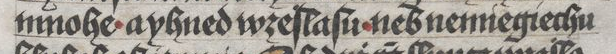mnohe.a yhned wzeẛla ſu.neb nemiegíechu
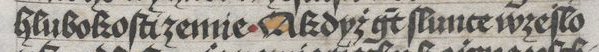hlubokoſtí zemie.A kdyż ḡt ſlunce wzeẛlo
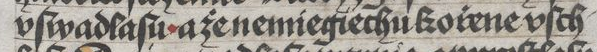vſwadlaſu.a że nemiegíechu koṙene vſch¬
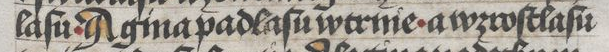la ſu.A gina padla ſu wtrnie.a wzroſtla ſu
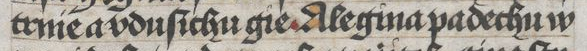trnie a vduſichu gie.Alegína padechu w
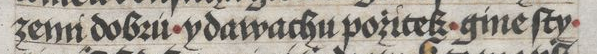zemi dobrú.y dawachu pożitek.gine ſty.
